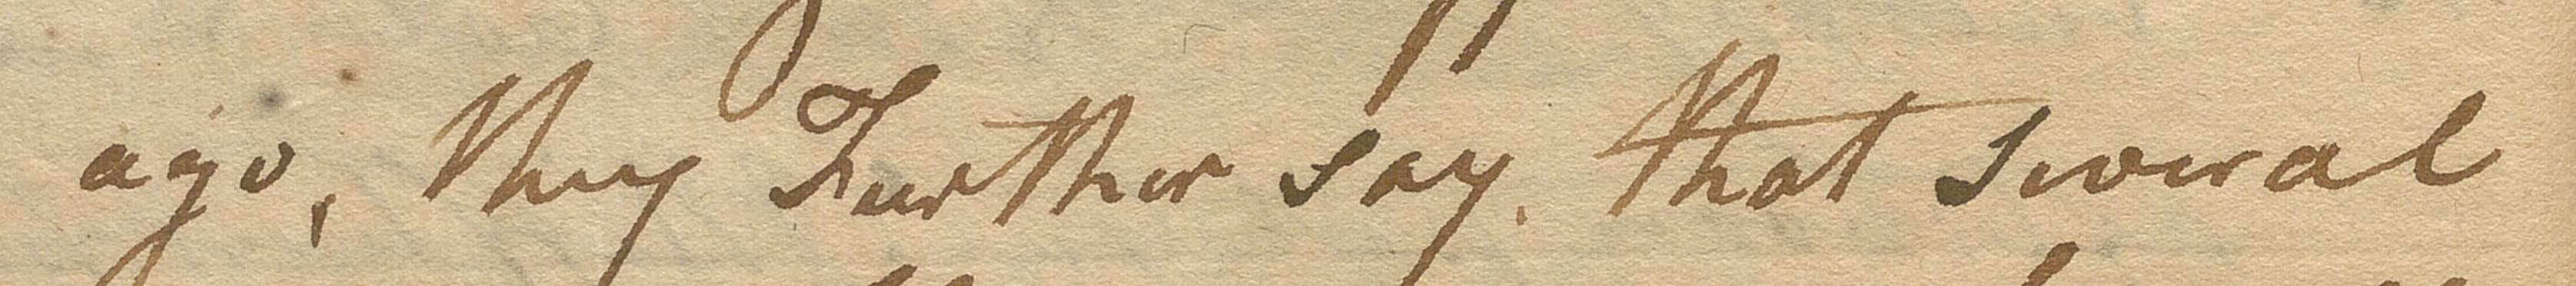ago, they Further say that several
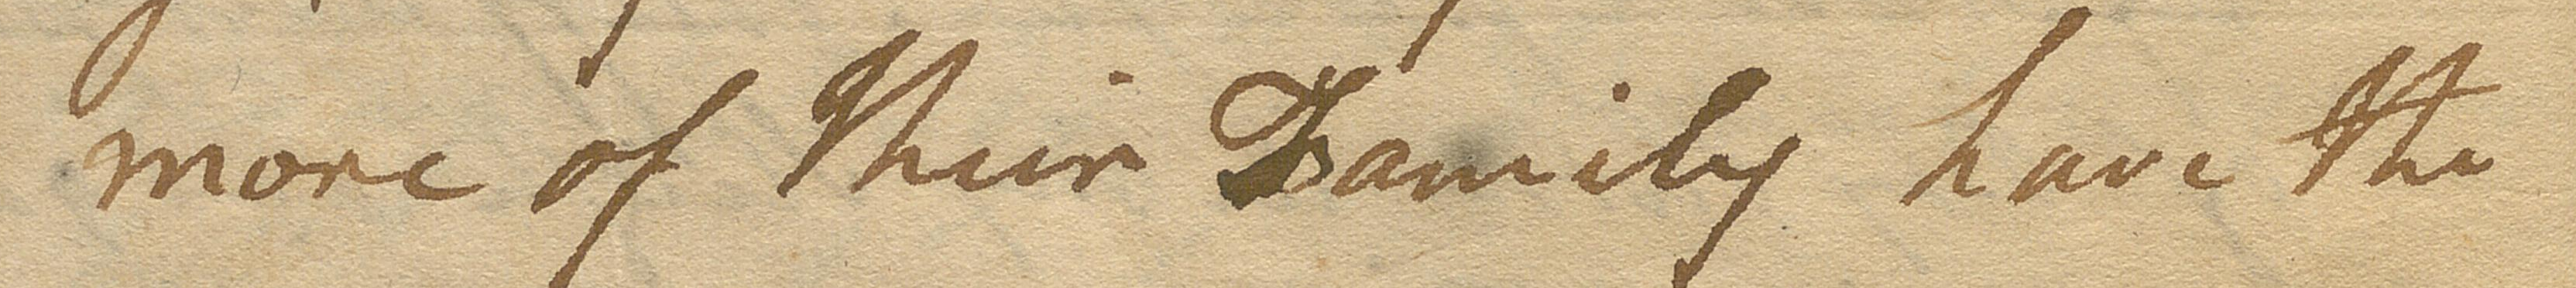more of Ther Family have the
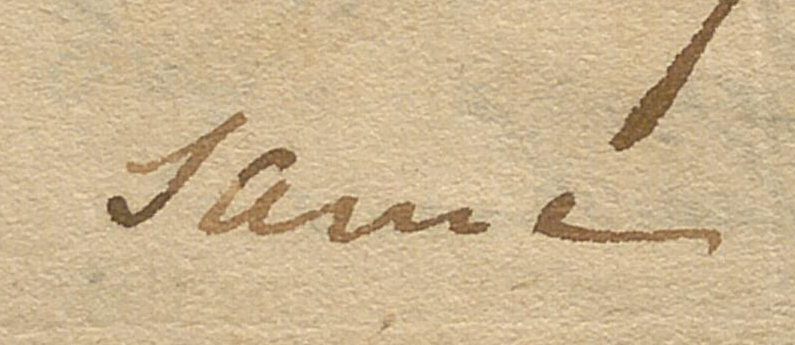Same
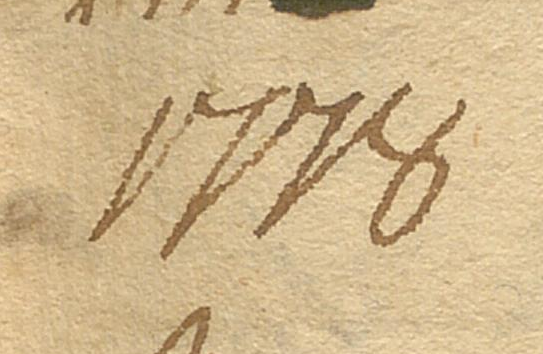1778
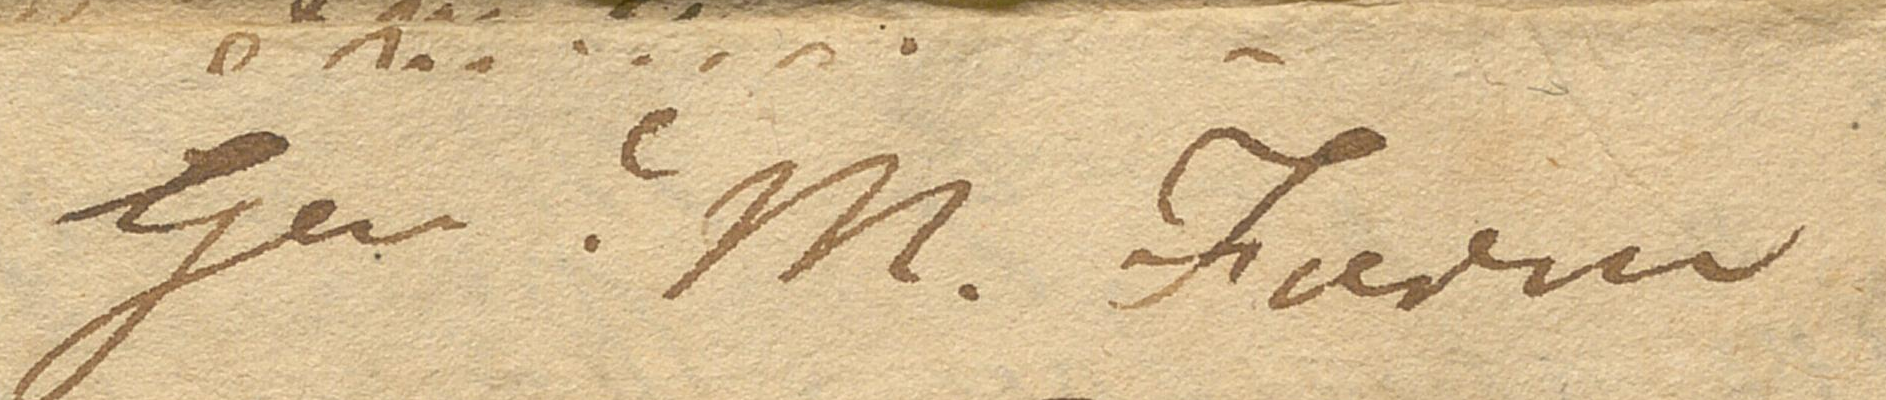Gen^l. M. Farm
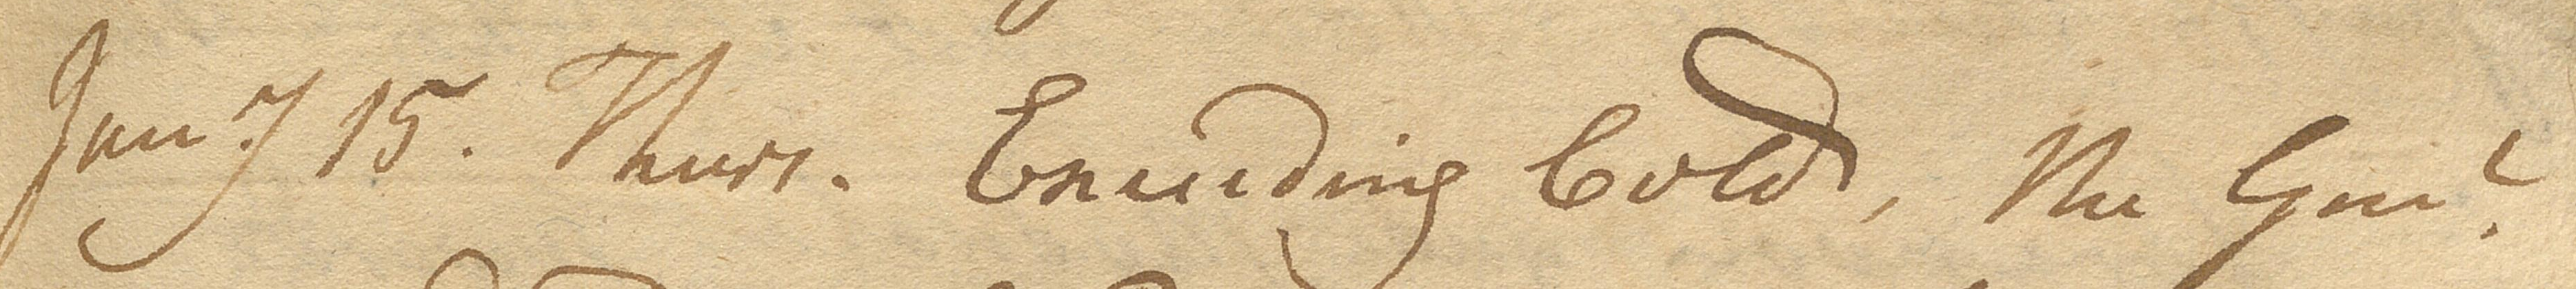Jan^y. 15. Thurs. Exceeding Cold, the Gen^l.
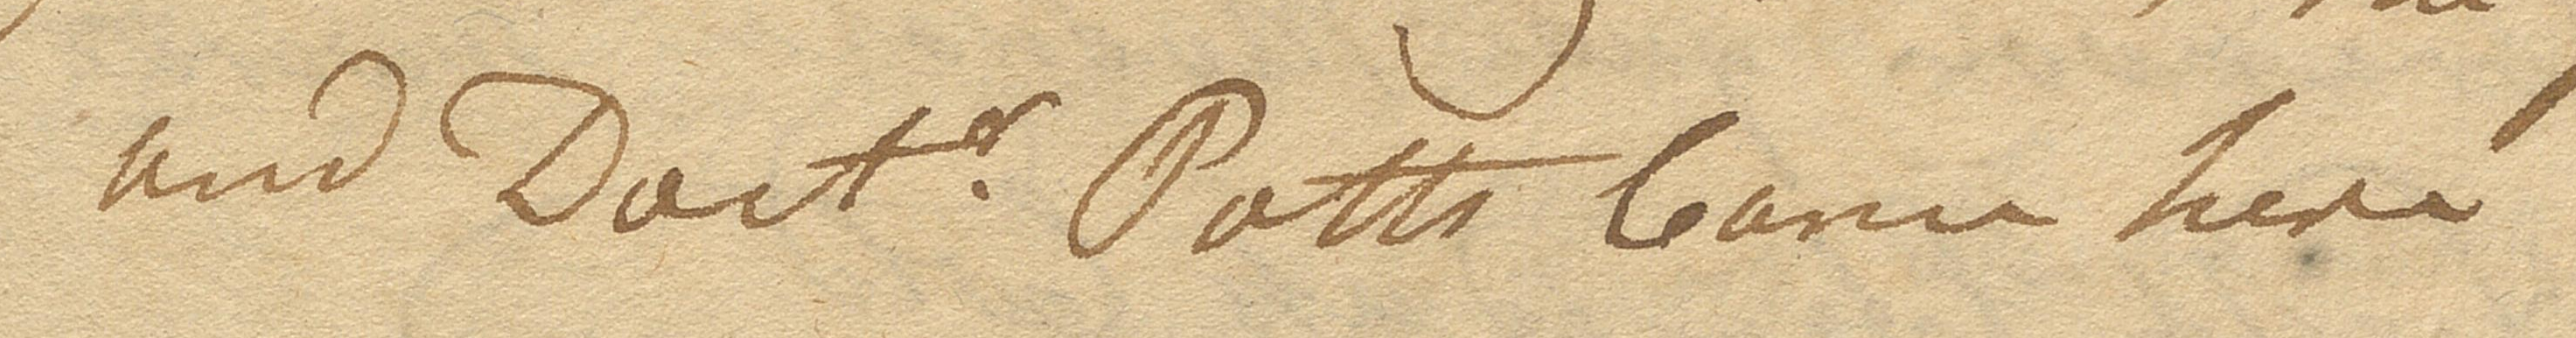and Doct^r. Potts Came here
